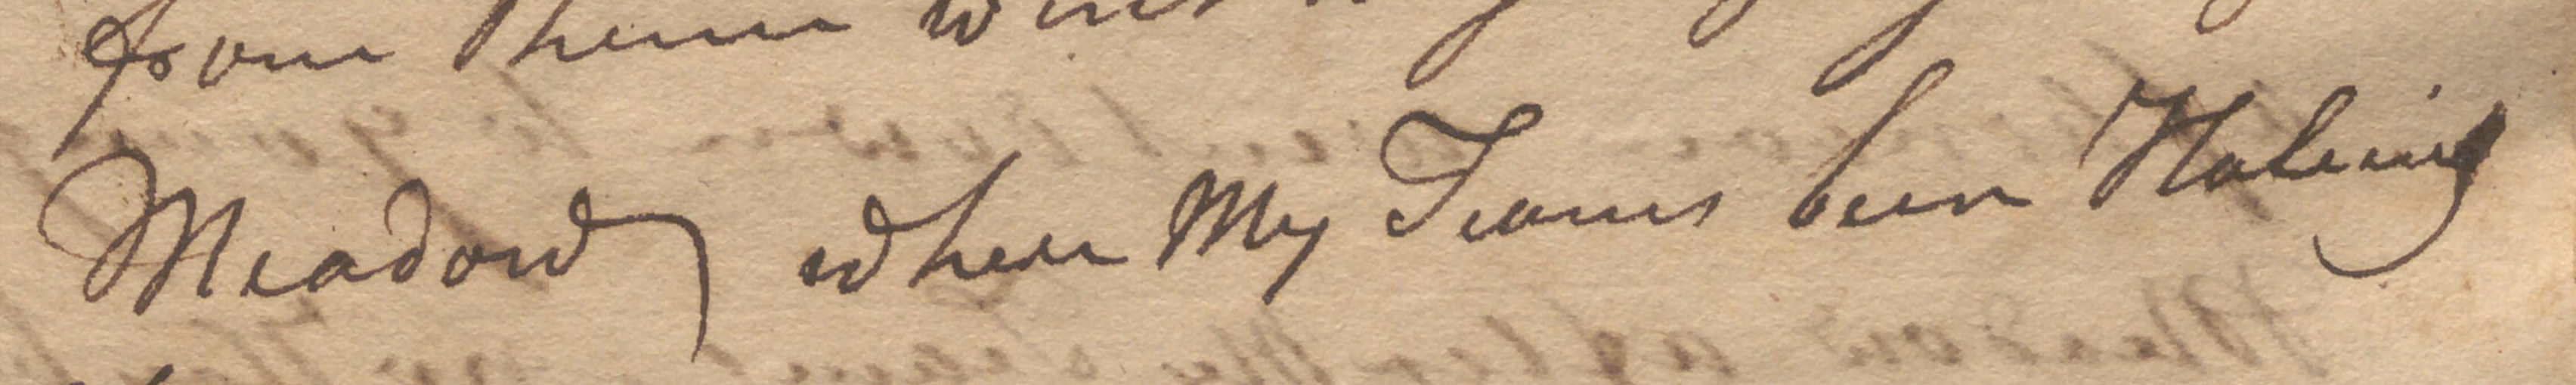Meadow when My Teams been Haling
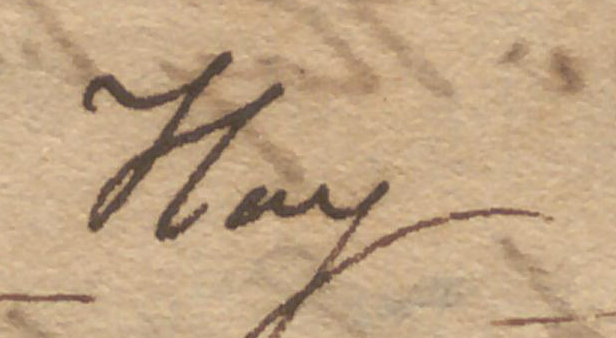Hay
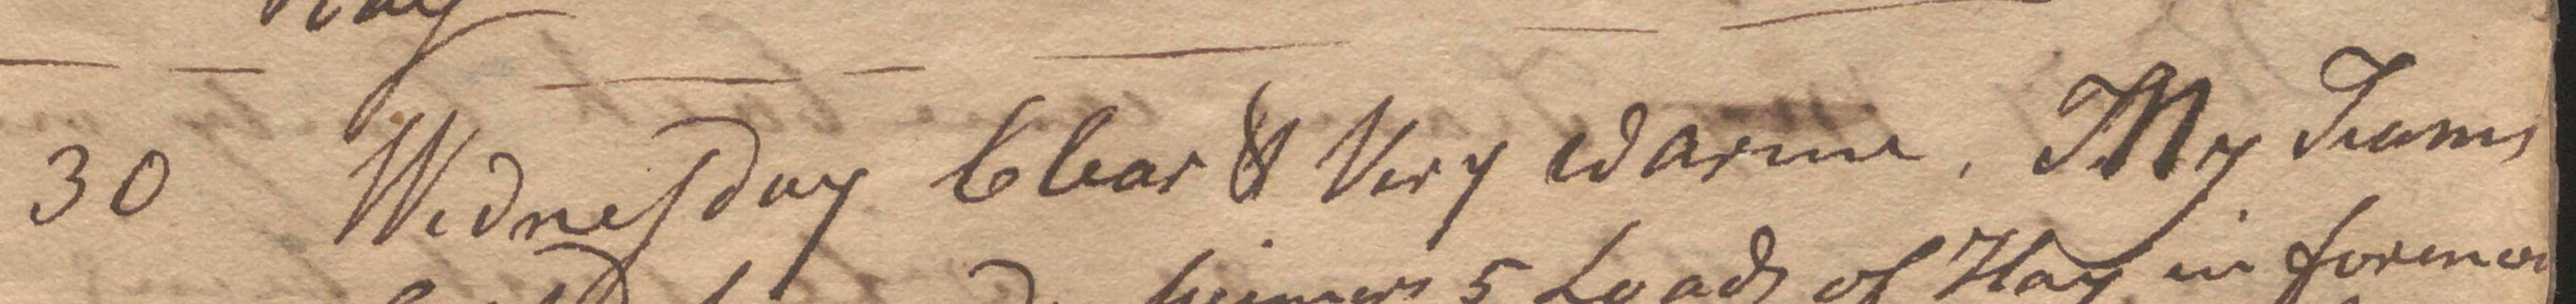30 Wednesday Clear & Very Warme, My Teams
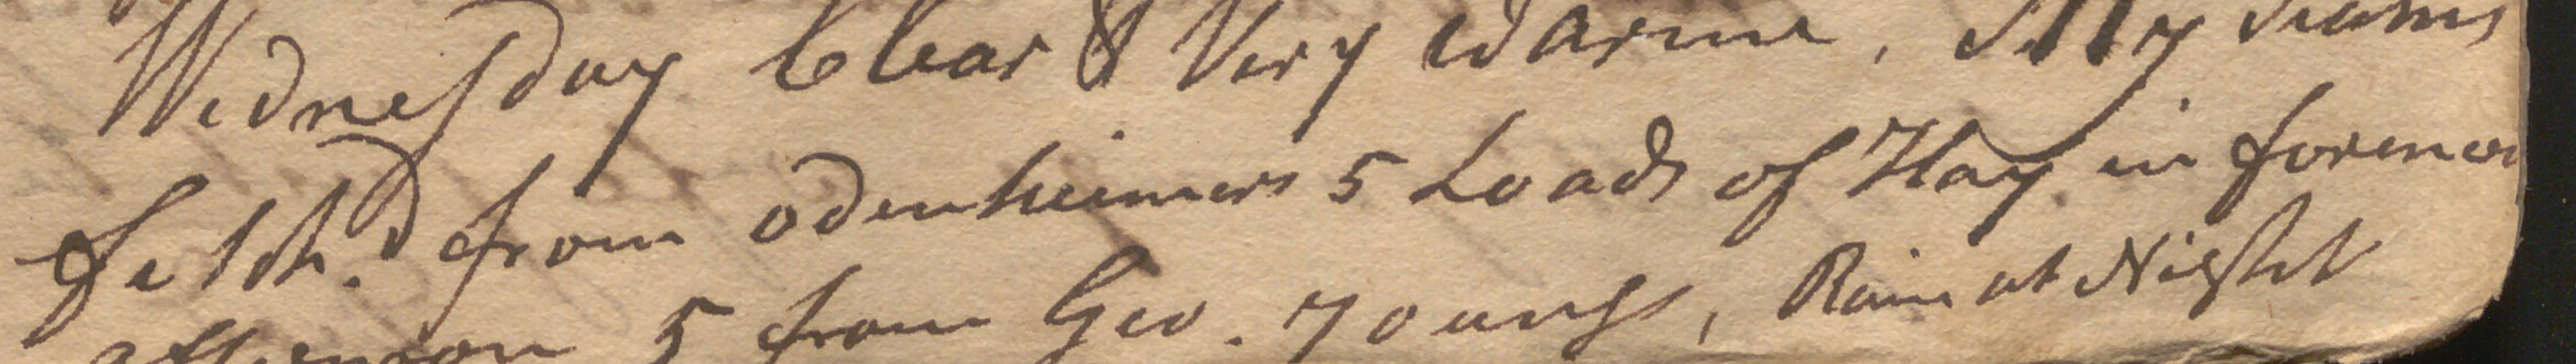fetch'd frou odenheimers 5 Loads of Hay. in fornoon
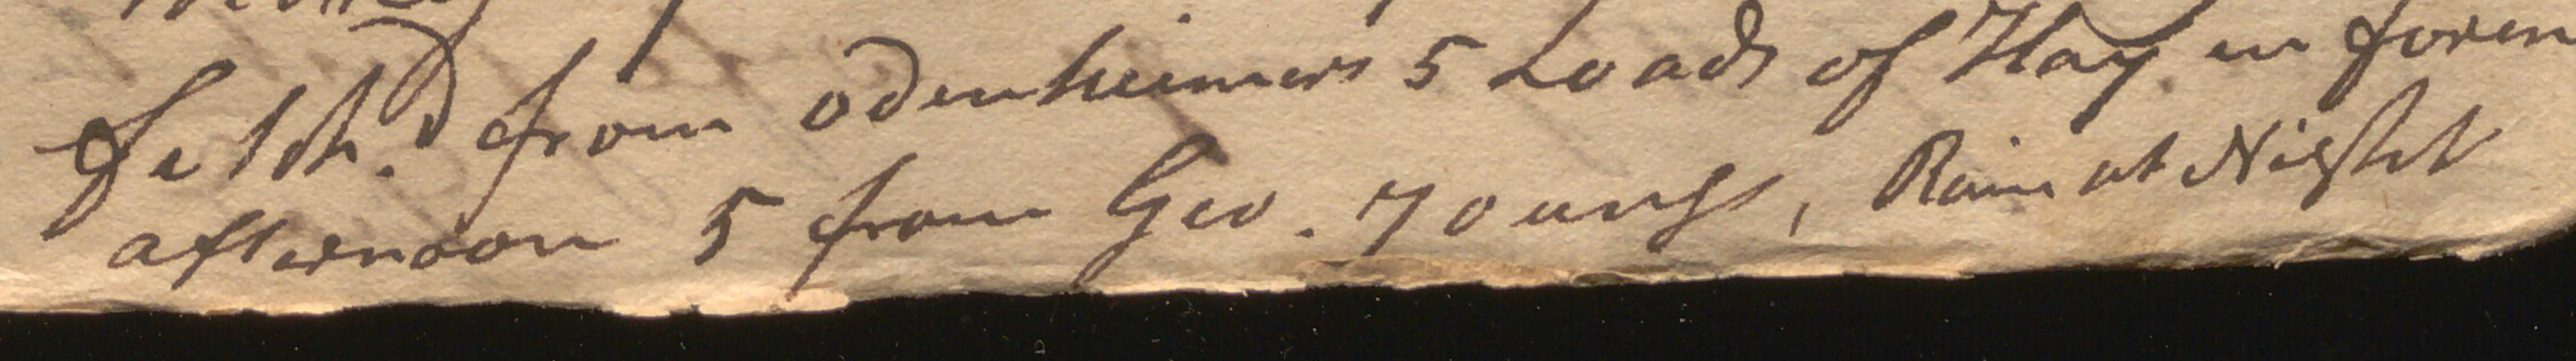afternoon 5 from Gen. youngs, Rain at Night
